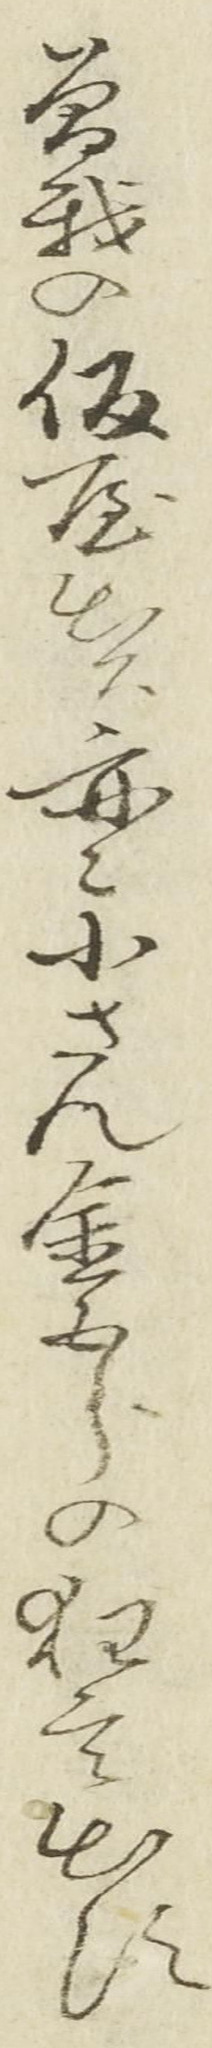曽我の仮屋出ス亦々小さん金五郎の狂言出す
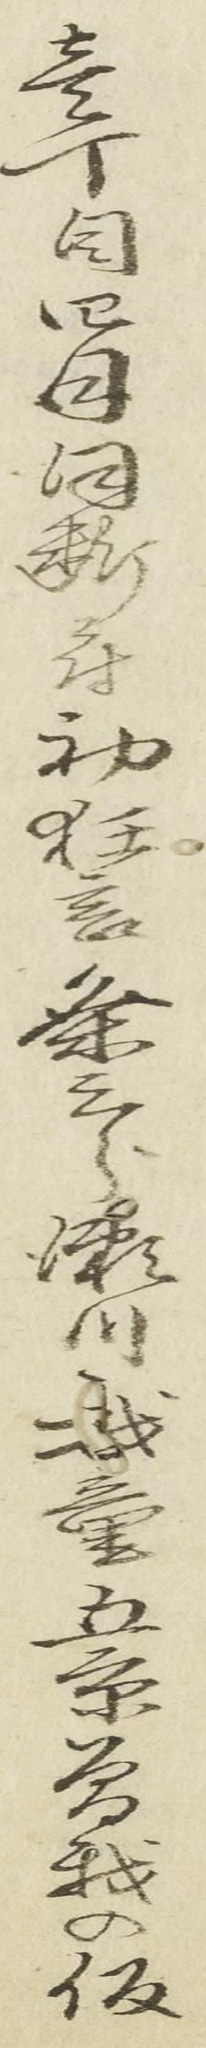壱丁目四月同断ニ付初狂言粂三郎瀬川我童五京曽我の仮
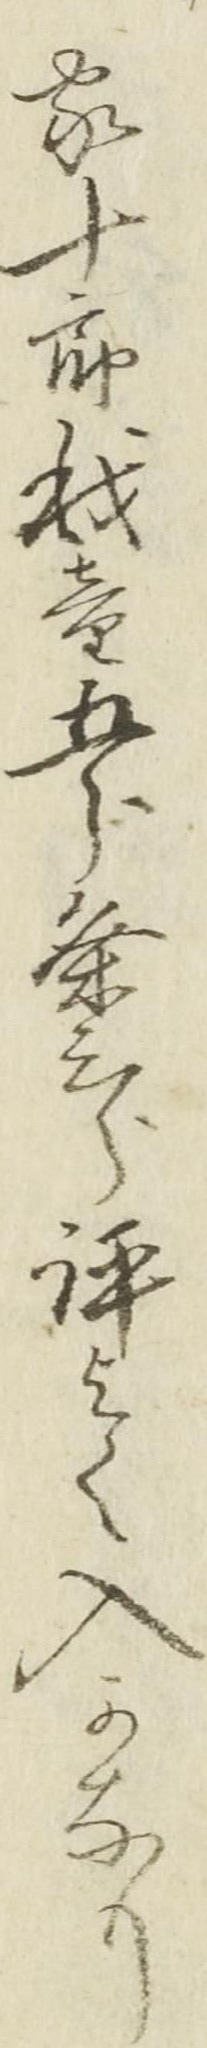家十郎我童五郎粂三郎評よく入かなり
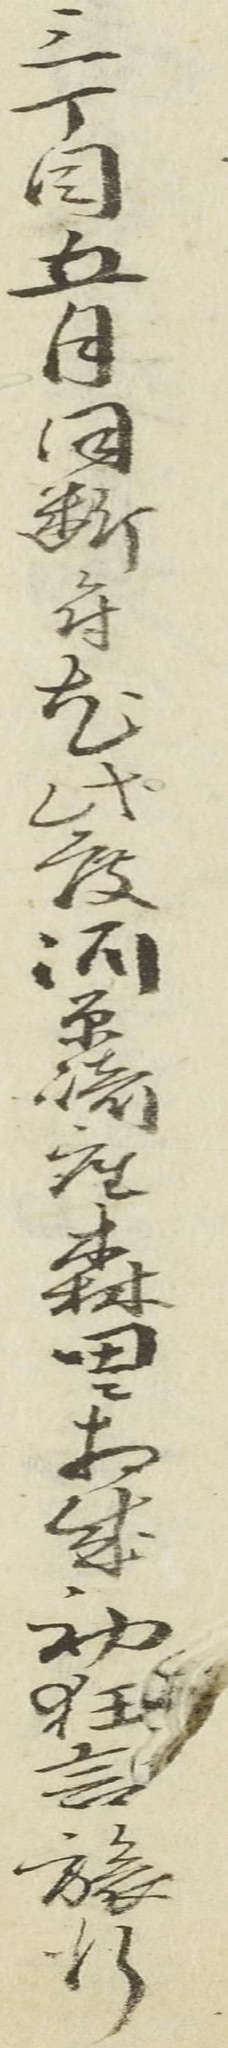三丁目五月同断ニ付尤此度河原崎座森田ニ相成初狂言旅行
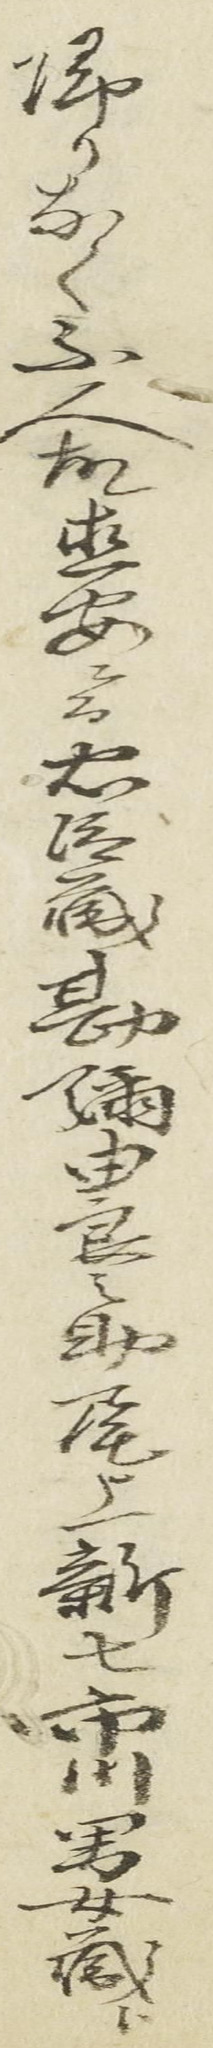帰りなく不人故直安ニ而忠臣蔵勘弥由良之助尾上新七市川男女蔵ト
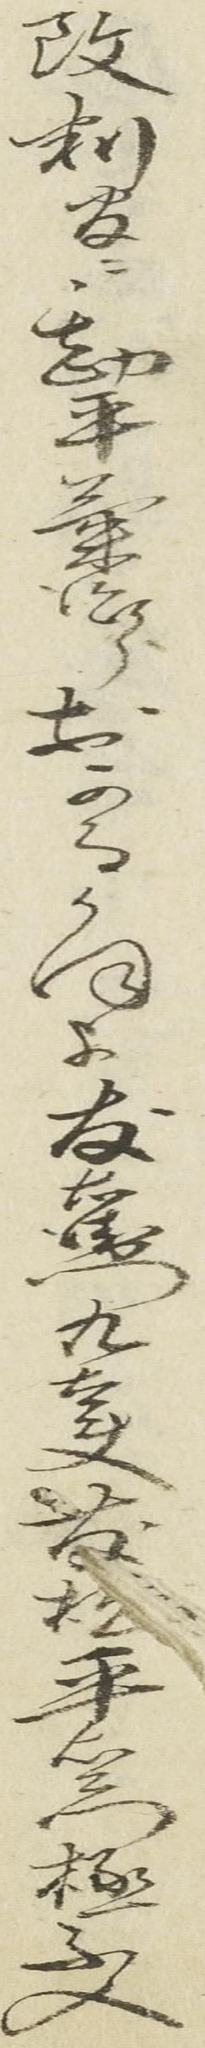改判官ニ勘平菊治郎おかるかほよ友右衛門九大夫友松平右衛門極不入
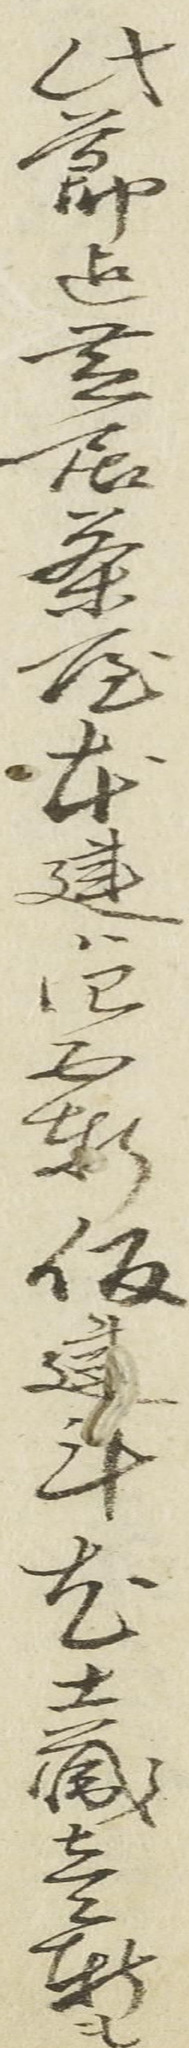此節迄芝居茶屋本建ハ四五軒仮建斗尤土蔵壱軒も
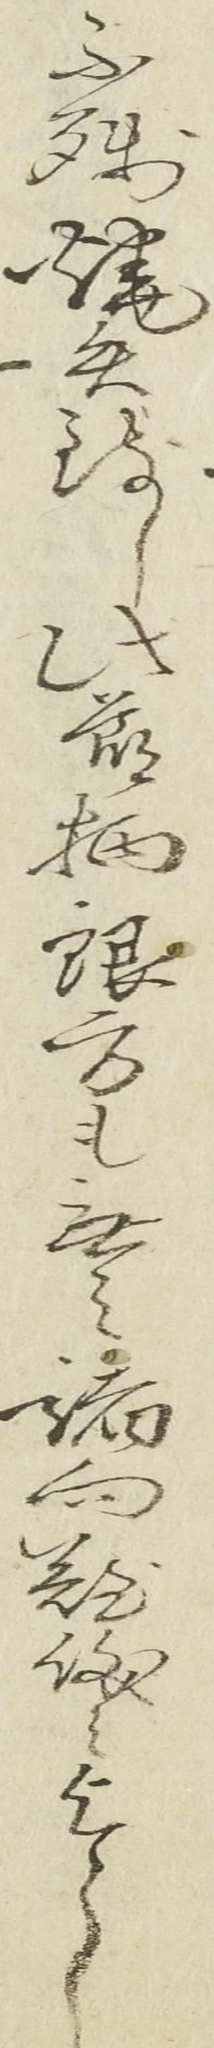不残焼死致し此節柄銀方も無之諸向難儀之よし
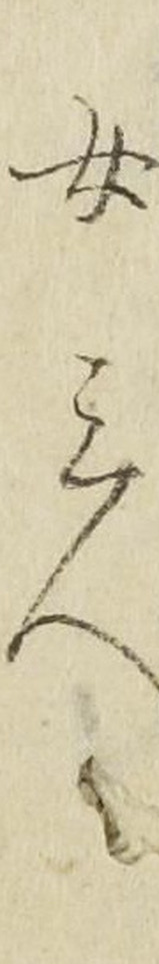女壱人
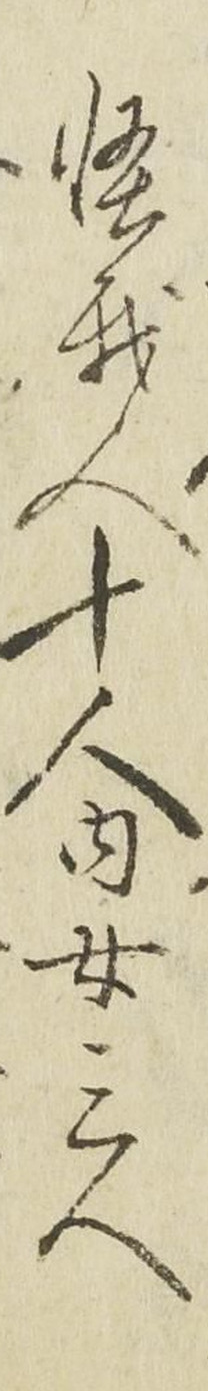同所怪我人壱人女三人
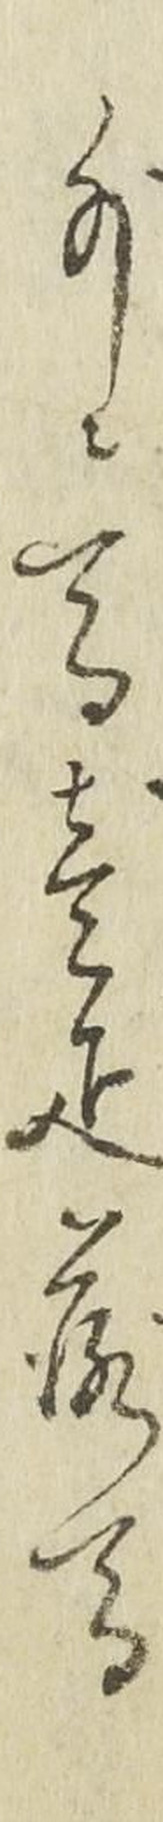外ニ馬壱疋落馬
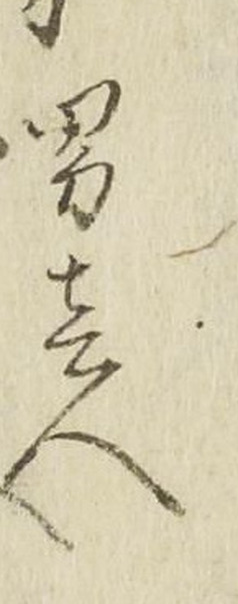女壱人
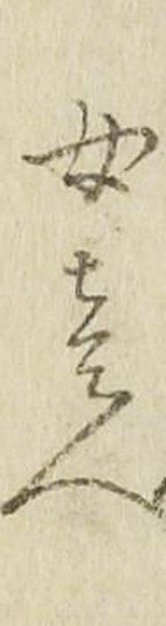女壱人

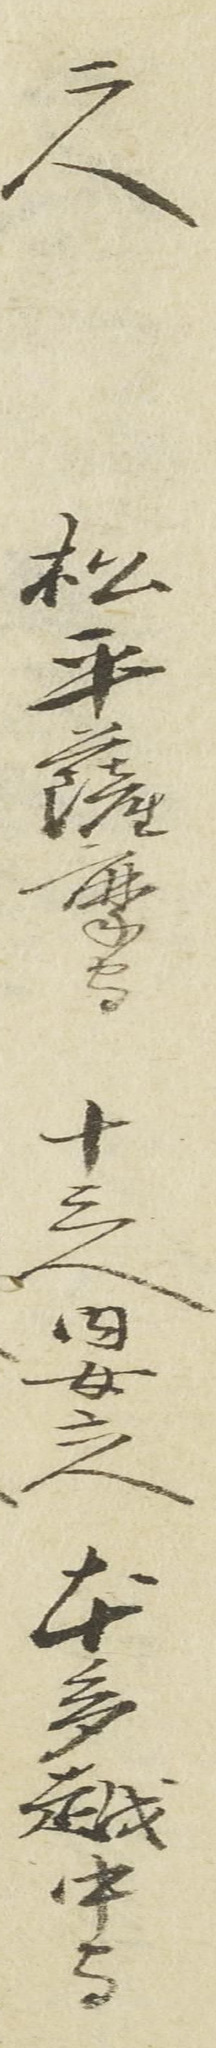二人松平薩摩守十三人内女六人本多越中守
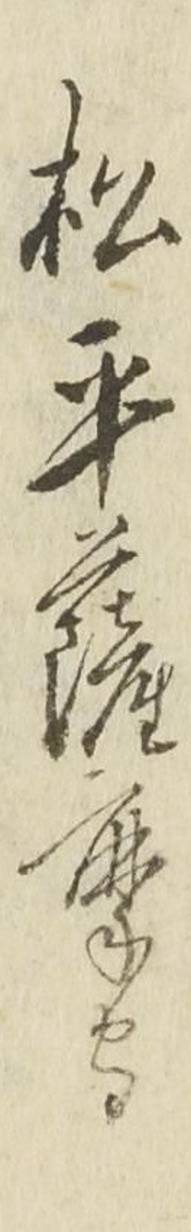松平伊賀守
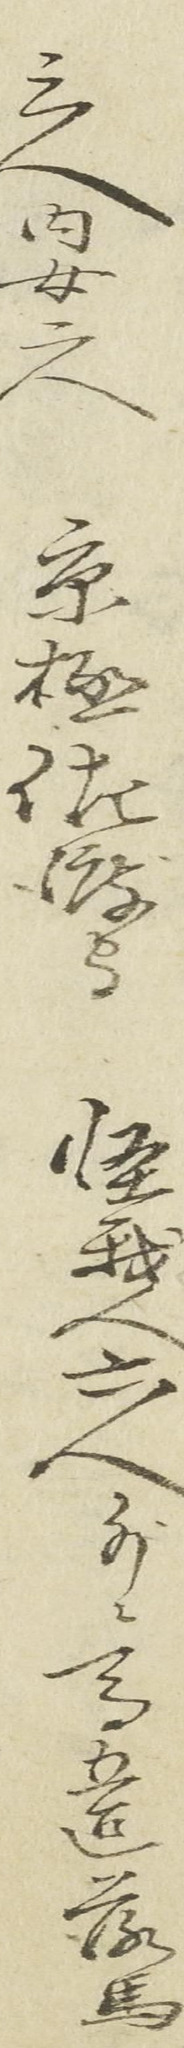三人内女二人京極佐渡守怪我人六人外二馬五疋落馬
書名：安政二乙卯年十月二日大地震之事
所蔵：東京大学地震研究所図書室 Earthquake Research Institute Library, The University of Tokyo, JAPAN
